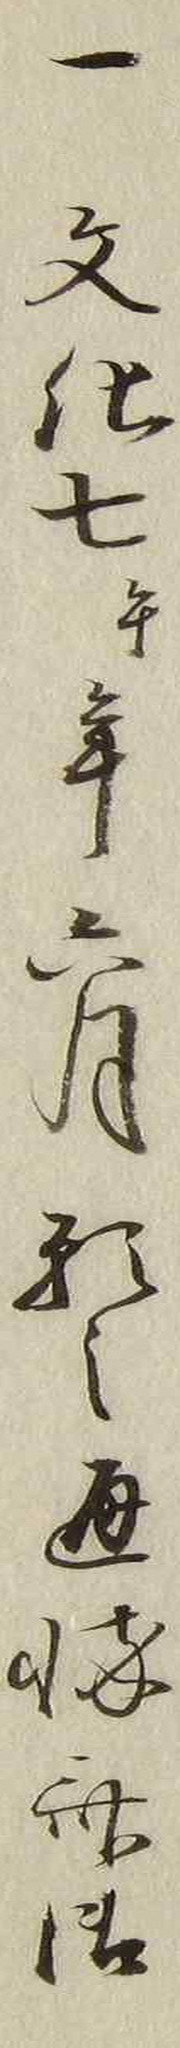一文化七午年六月願之通忰斎御
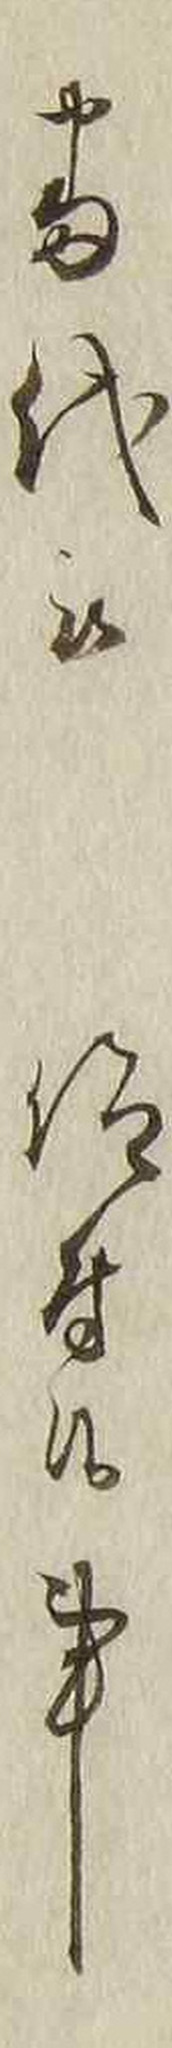番代被被仰付候事

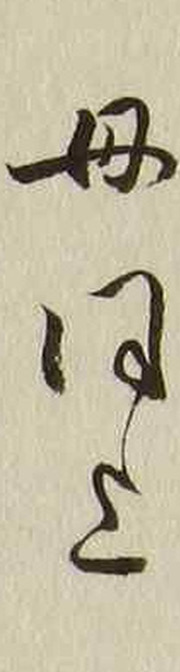母同上
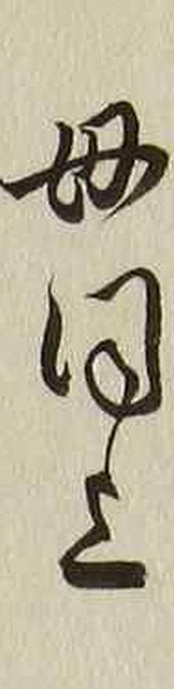母同上
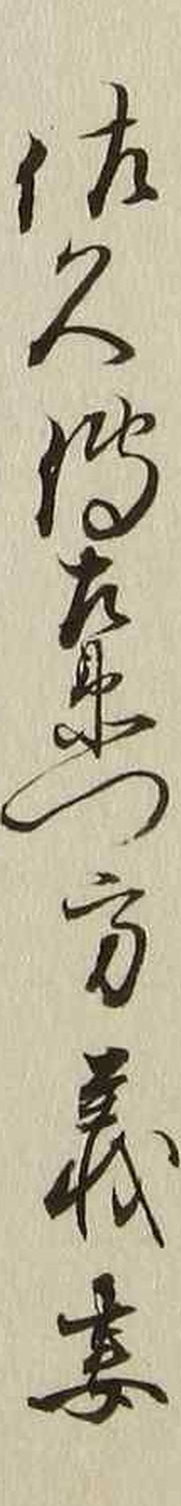女佐久伝左衛門方義妻
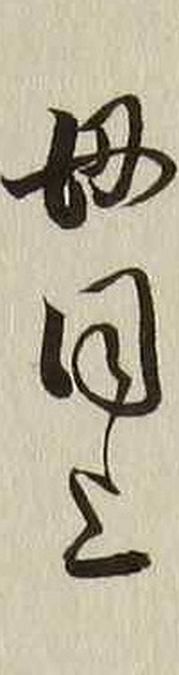母同上
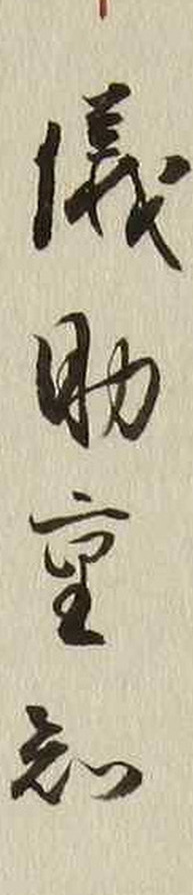儀助重知
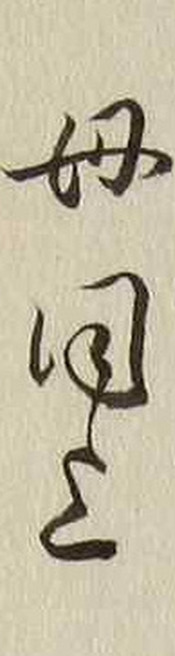母同上
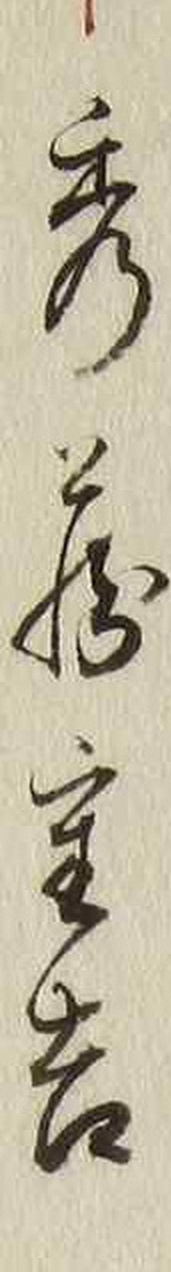秀蔵重吉
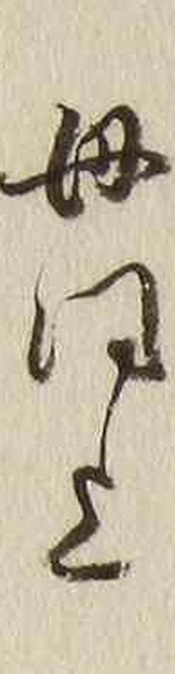母同上
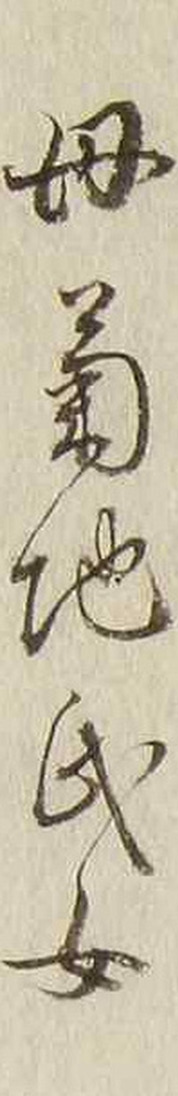母菊地氏女

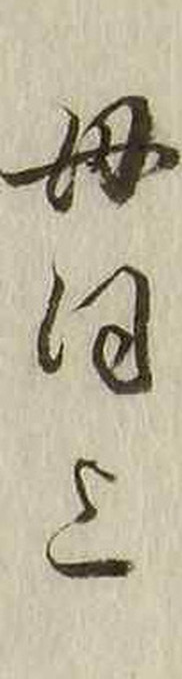母同上
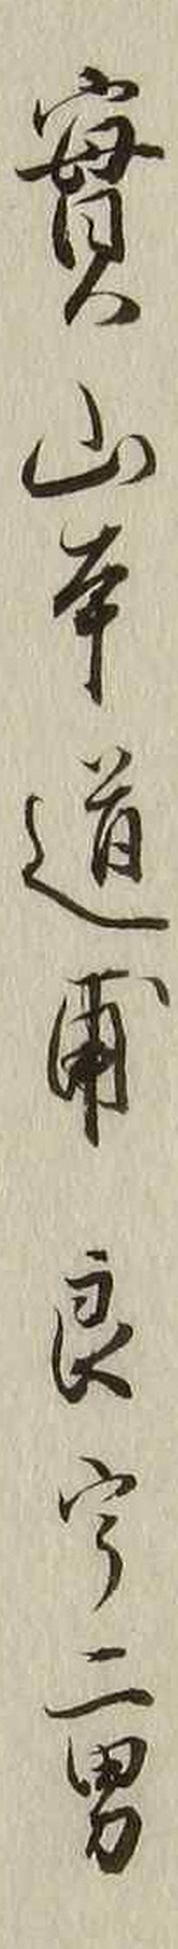実山本道甫良宇二男
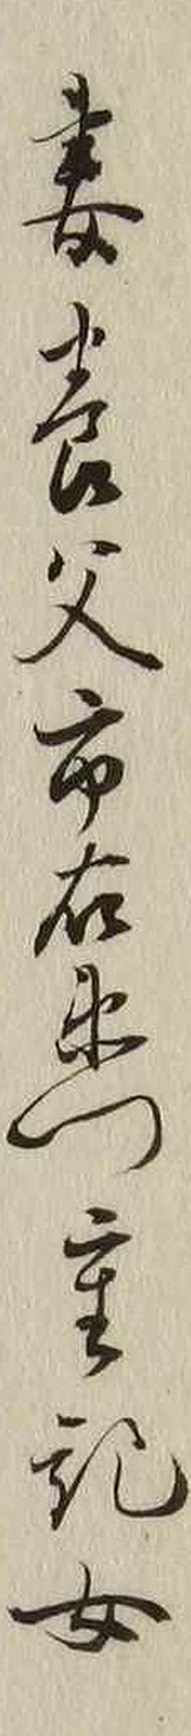妻養父市右衛門重記女
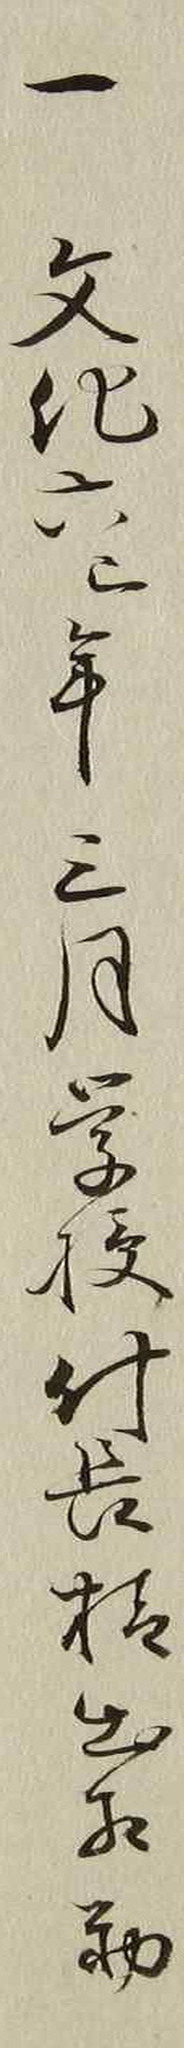一文化六巳年三月学校什長精出相勤
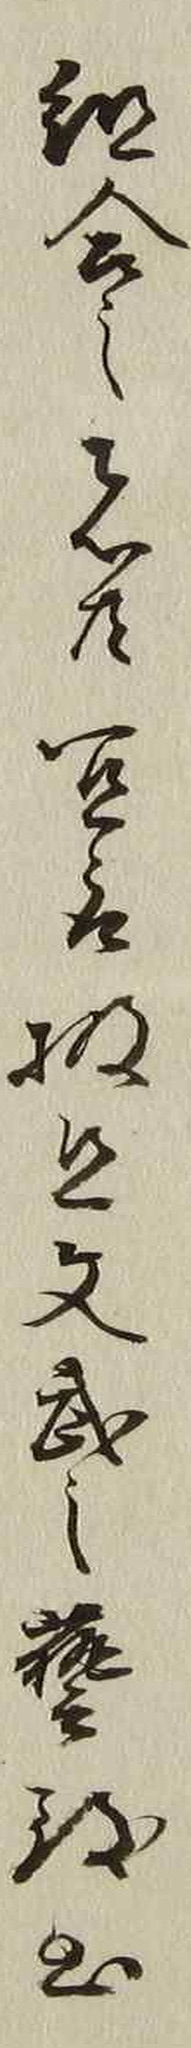組合之者共宜取扱且文武之芸致出
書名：諸士系譜　巻之26　い之部26
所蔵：会津若松市立会津図書館
